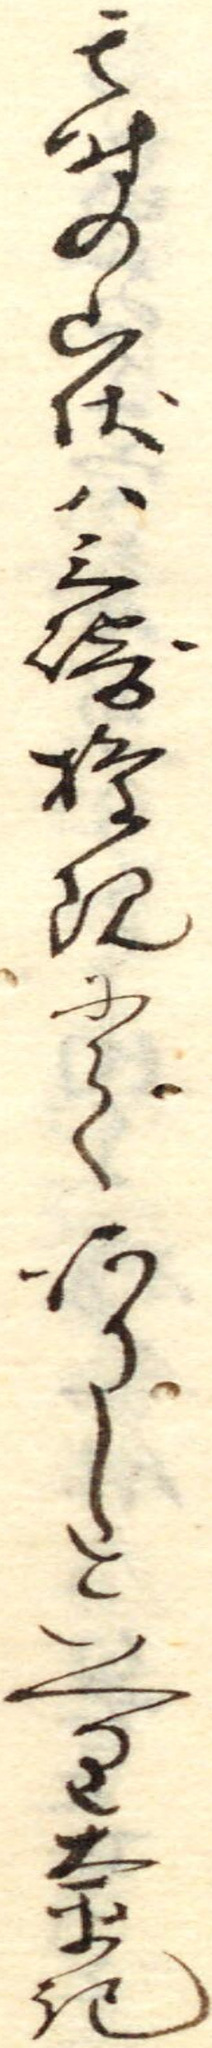其時の山伏は三崎権現にてありしといへり大平記
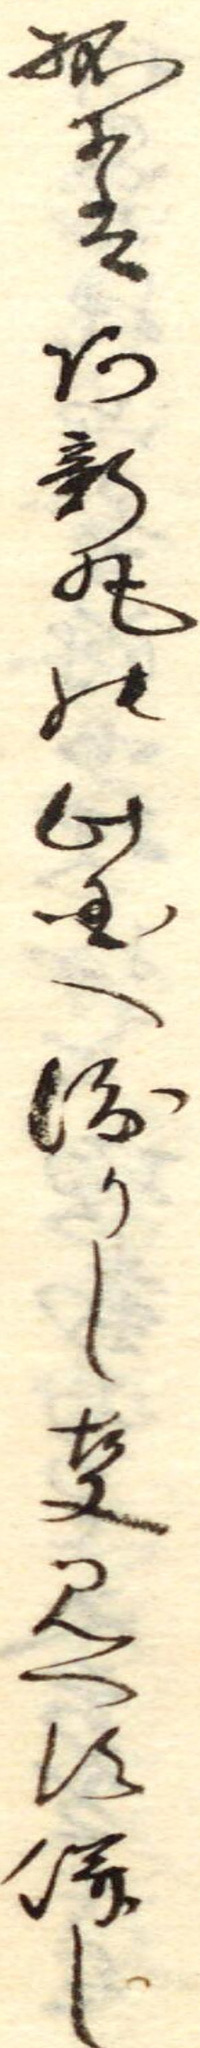抔には阿新丸の此国へ渡りし事見へす併し
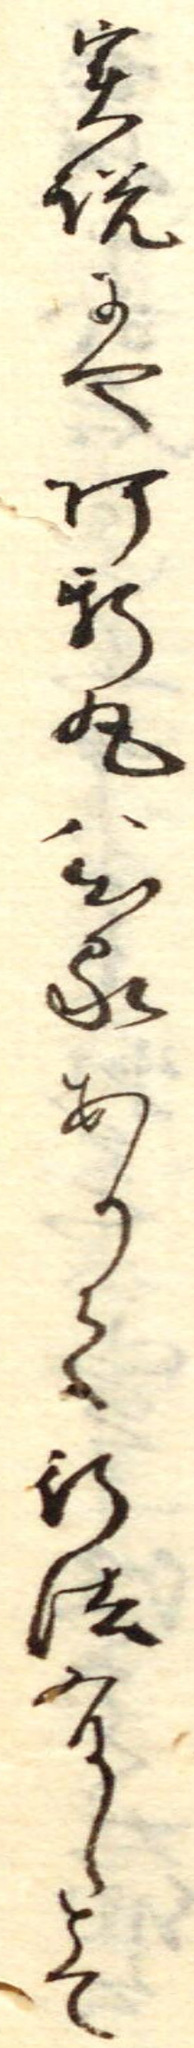実説にや阿新丸は出家ありて行法有しとて
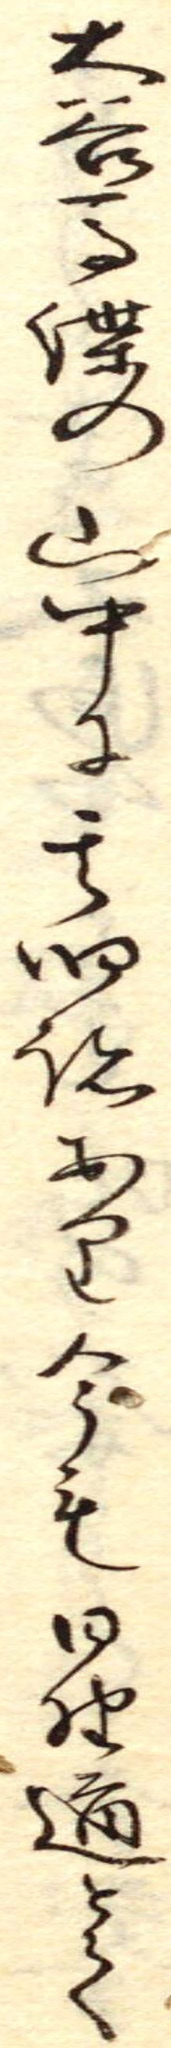大谷馬緤の山中に其旧跡あり今も日野道とて
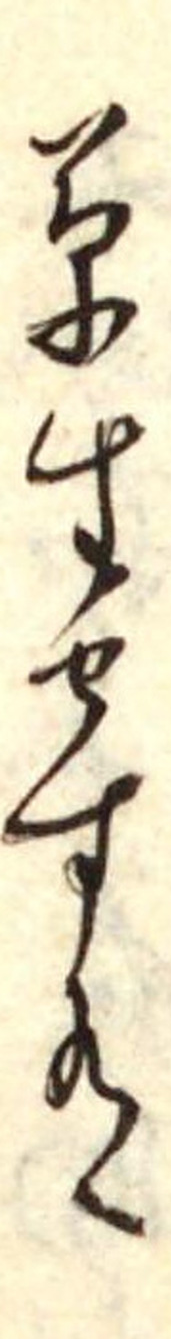草生せす有
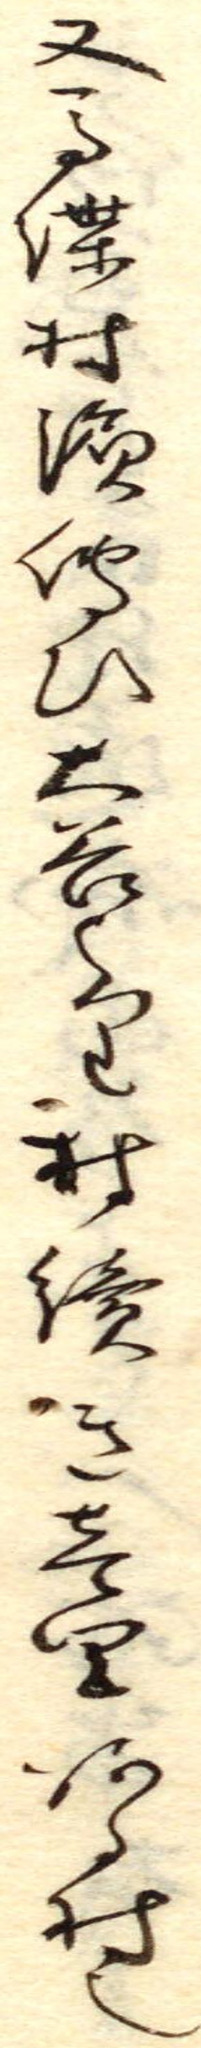又馬緤村浜伝ひ大谷より村て続き壱里ある村也
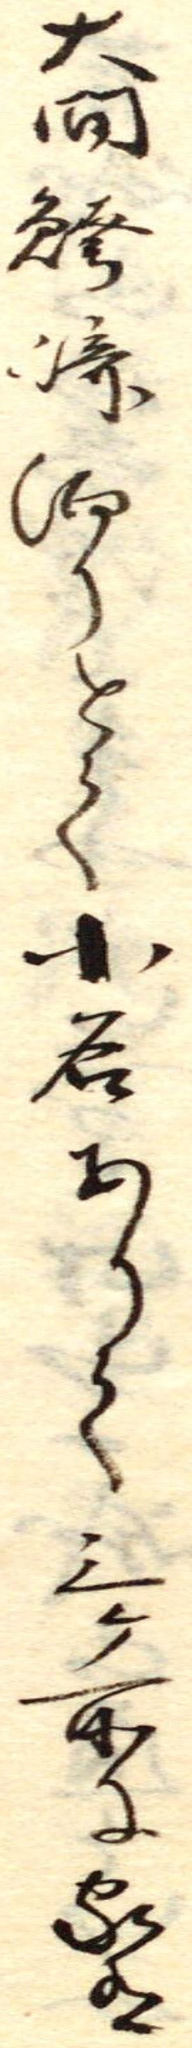大間鰐崎泊りとて小名あり三ヶ所に家有
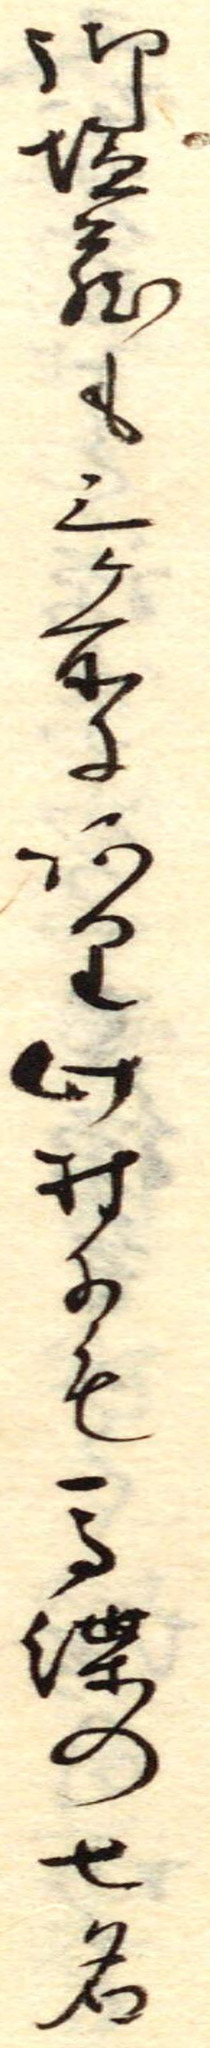御塩蔵も三ヶ所にあり此村にも馬緤の七名
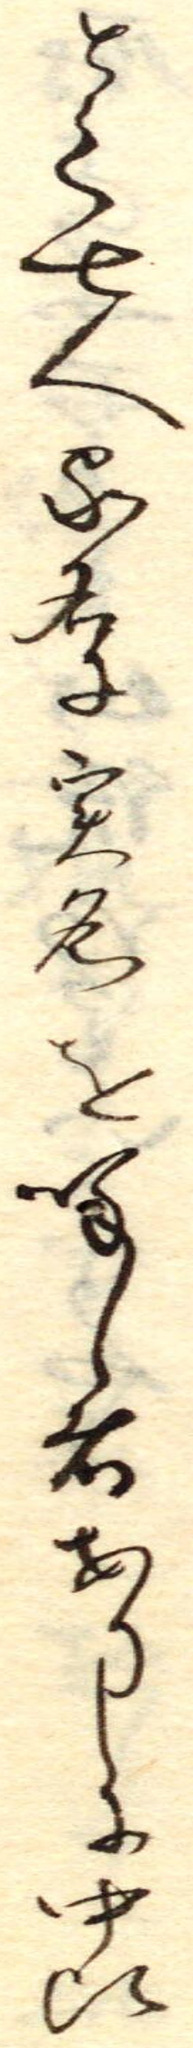とて七人家名に実名を呼し者ありしに中頃
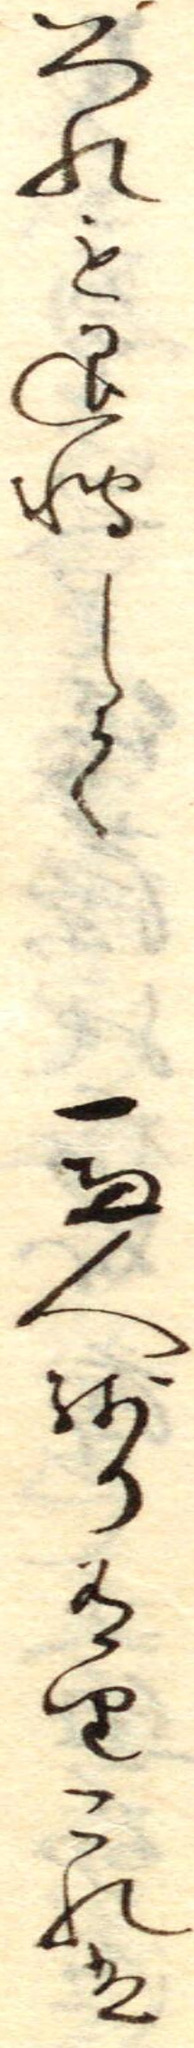いつれも退転して一両人残り有由これは
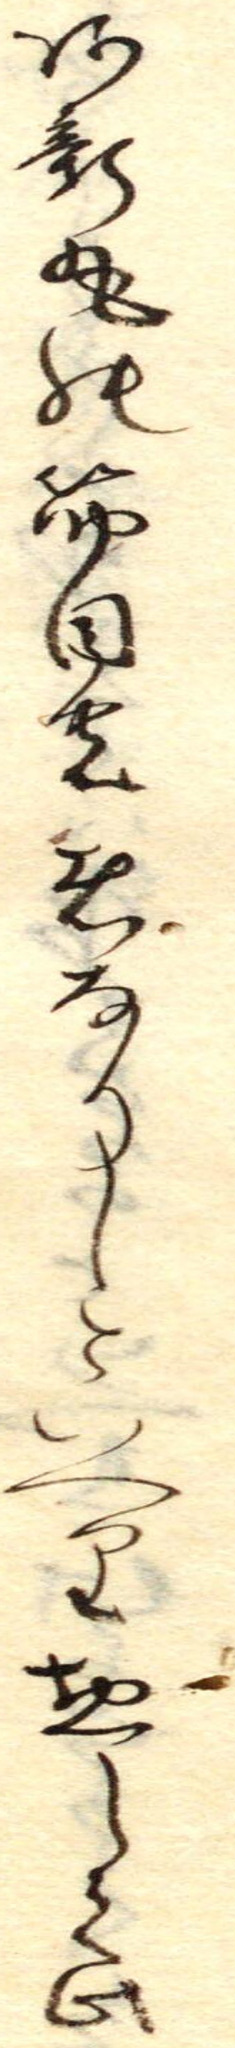阿新丸の筋目の者なりしといへり惣して此
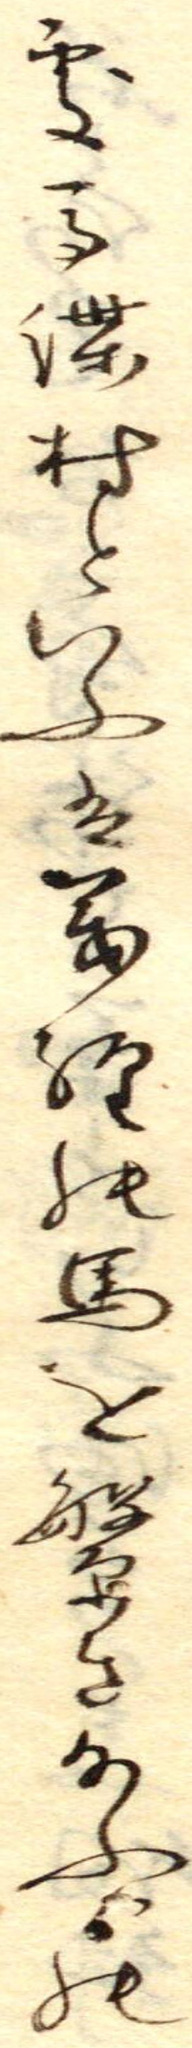処馬緤村といふは義経の馬を繁き給ふゟの

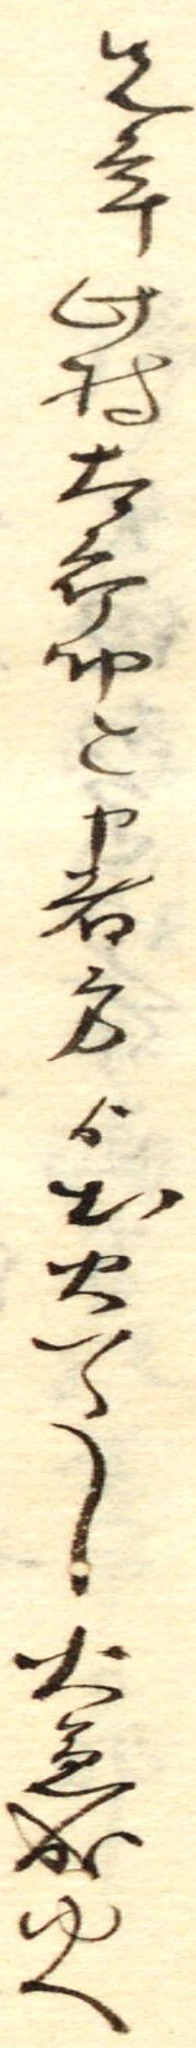先年此村太郎助と申者方ゟ出火いたし火急成ゆへ
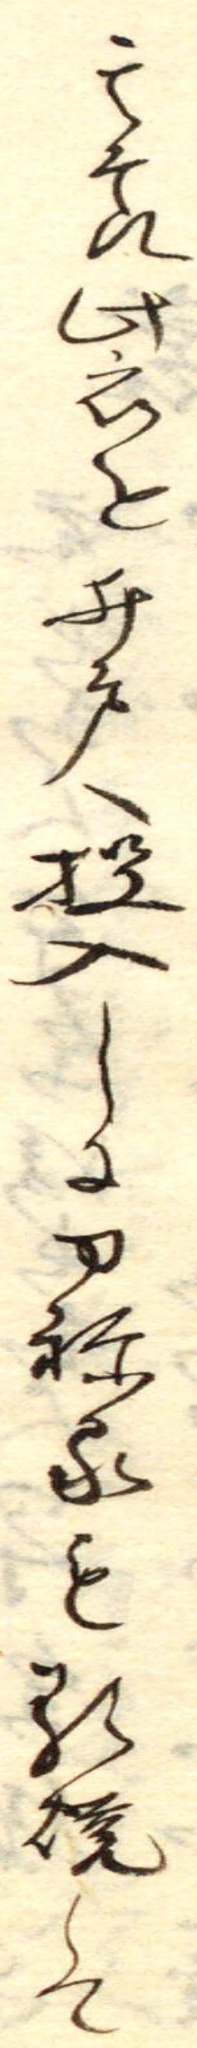其節此衣を井戸へ投入しに刀祢家も類焼して
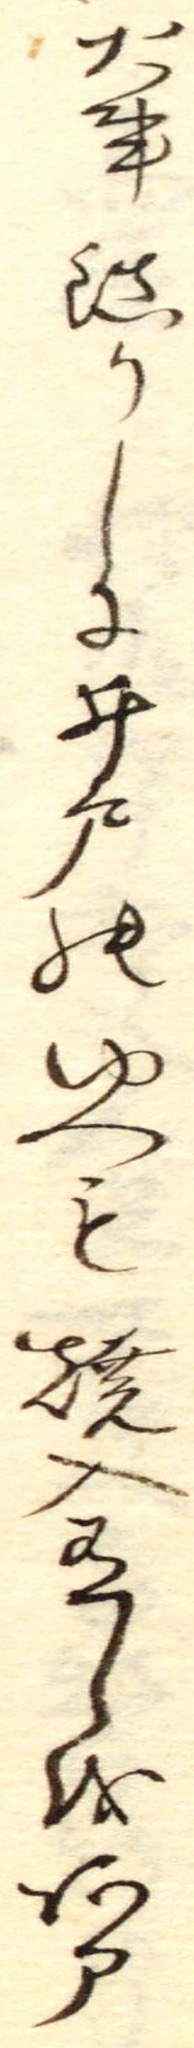鍛冶火事鎮りしに井戸の内へも焼入有しを阿部
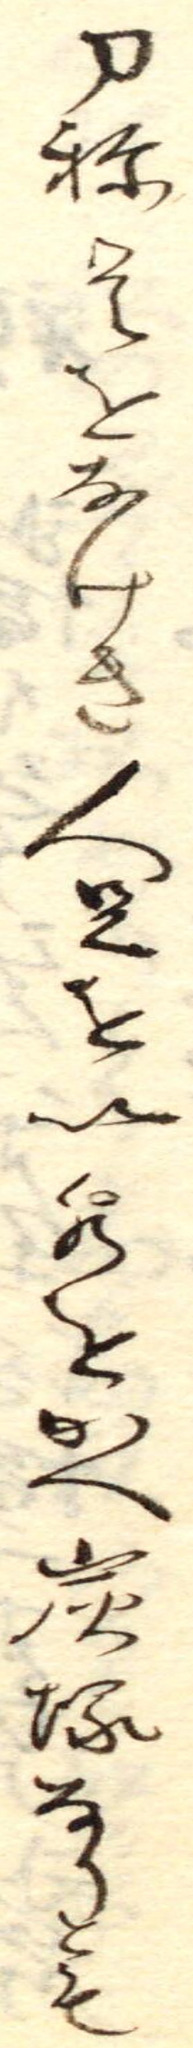刀祢是をなけき人足を以水をかへ炭塚なりとも
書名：能登名跡誌
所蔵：Ishikawa Prefectural Library
